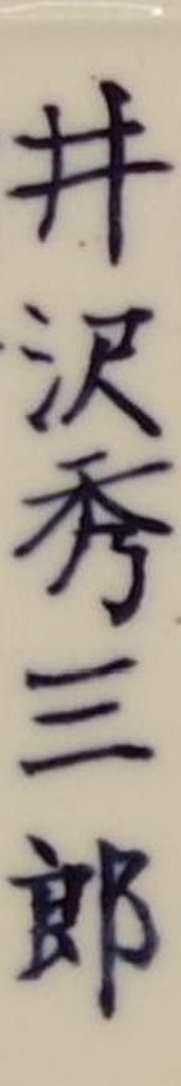井沢秀三郎
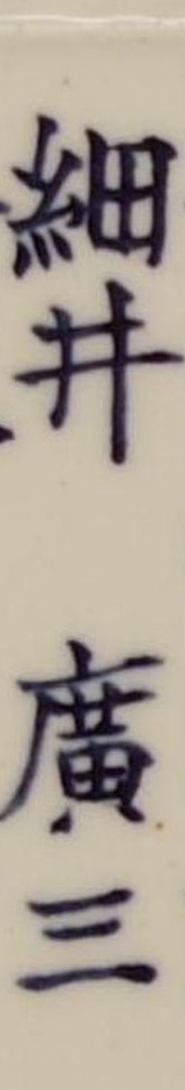細井廣三
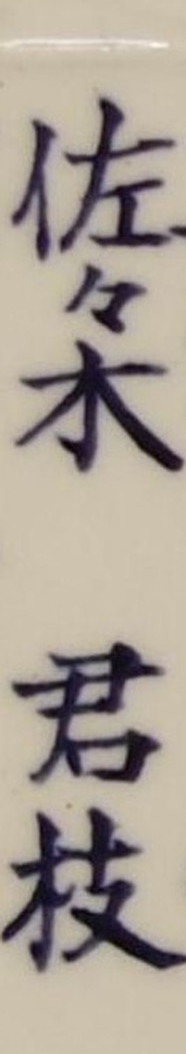佐々木君枝
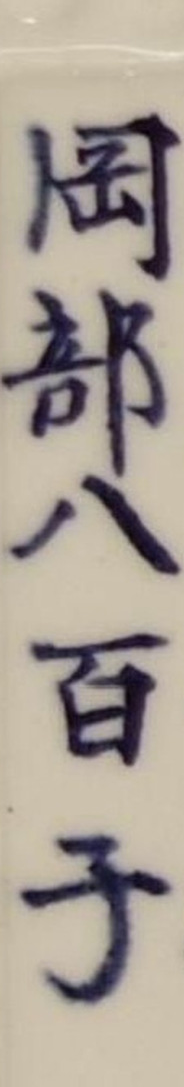岡部八百子

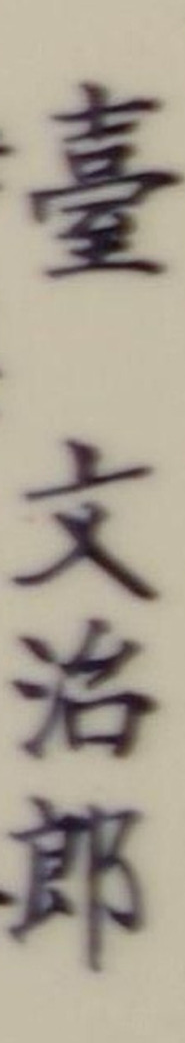臺文治郎
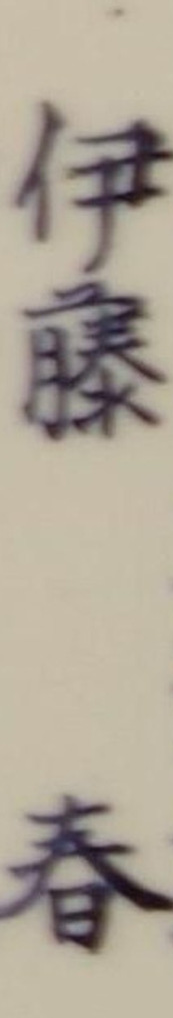伊藤春
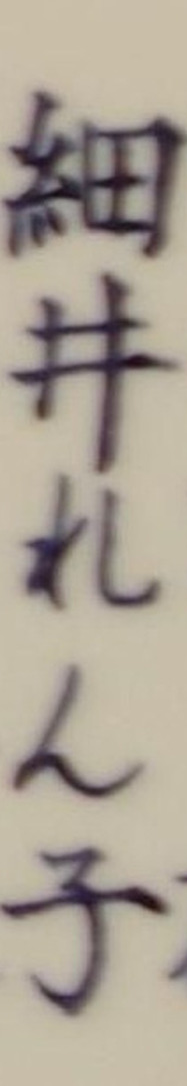細井れん子
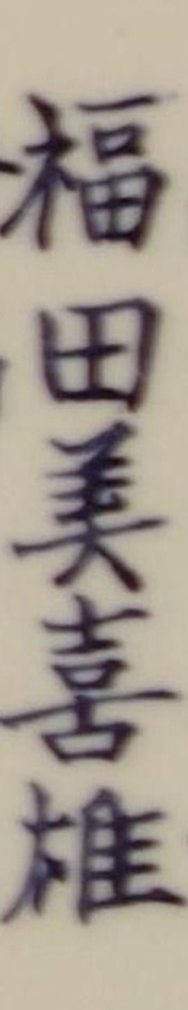福田美喜雄
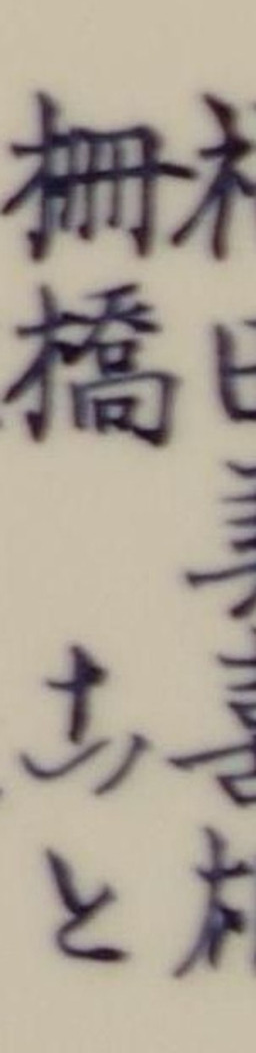柵橋こと
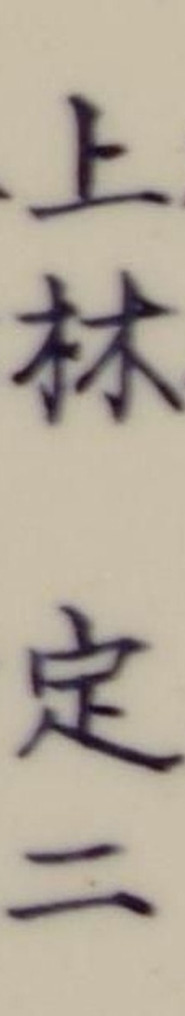上林定二
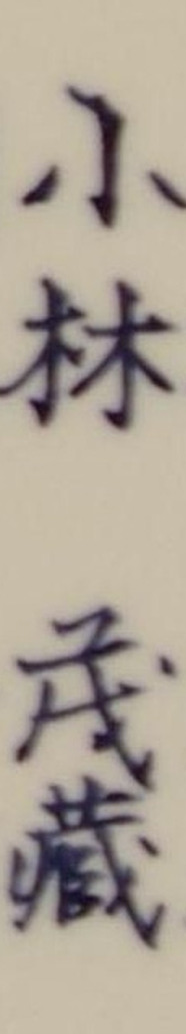小林茂蔵
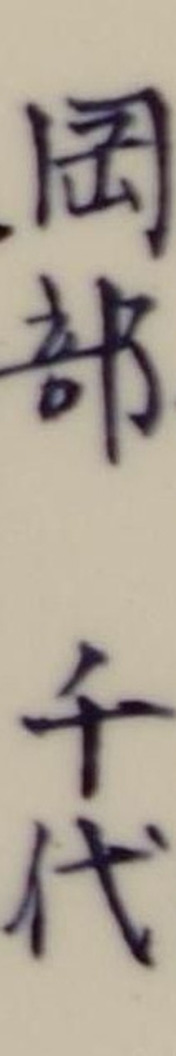岡部千代
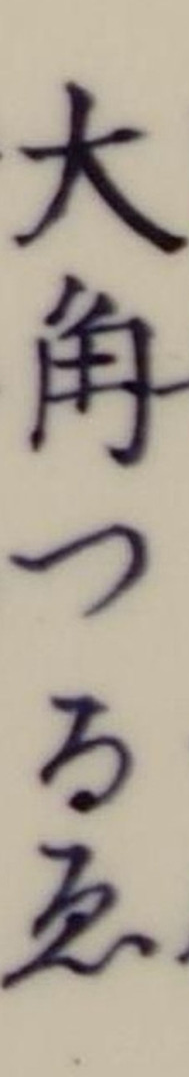大角つるゑ
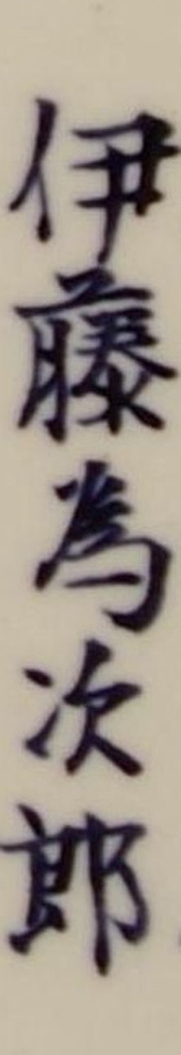伊藤為次郎
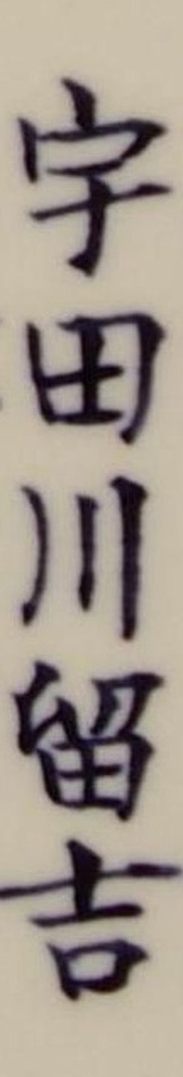宇田川留吉
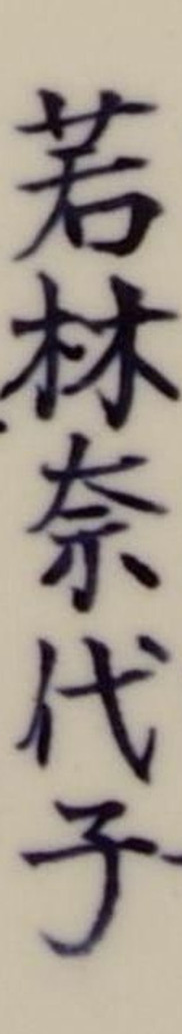若林奈代子
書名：M~S
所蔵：高野山金剛峯寺
